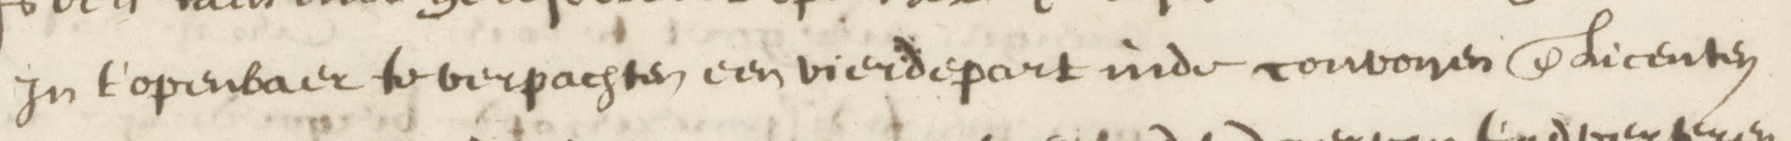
In 't'openbaer te verpachten een vierdepart inde convoyen & Licenten
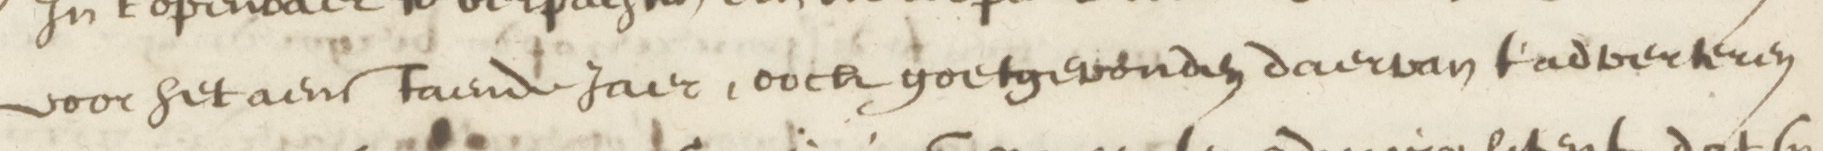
voor het aenstaend jaer, oock goetgevonden daervan t' adverteren
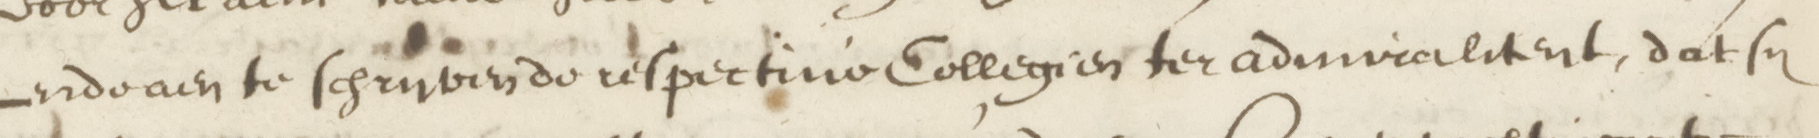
ende aen te schryven de respectiue Collegien ter admiraliteyt, dat sy
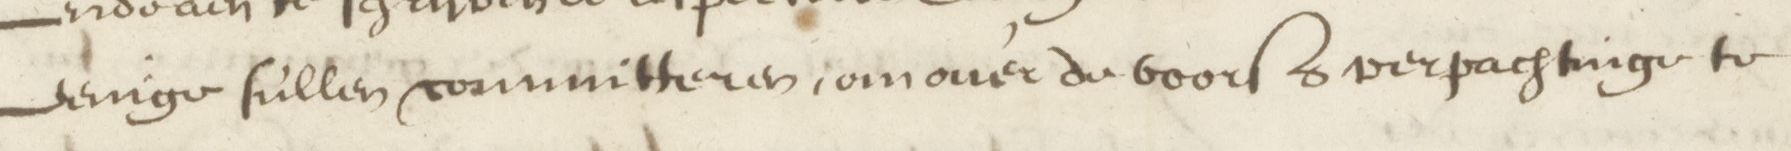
eenige sullen committeren, om ouer de voors verpachtinge te
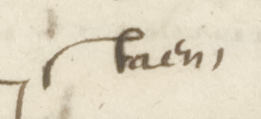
staen.
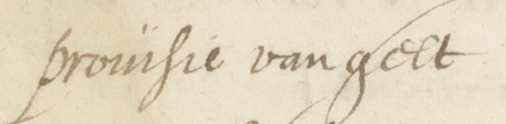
prouisie van gelt
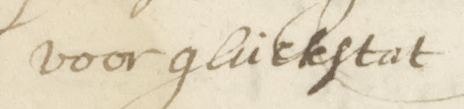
voor gluckstat
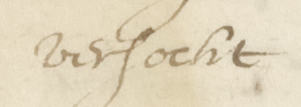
versocht
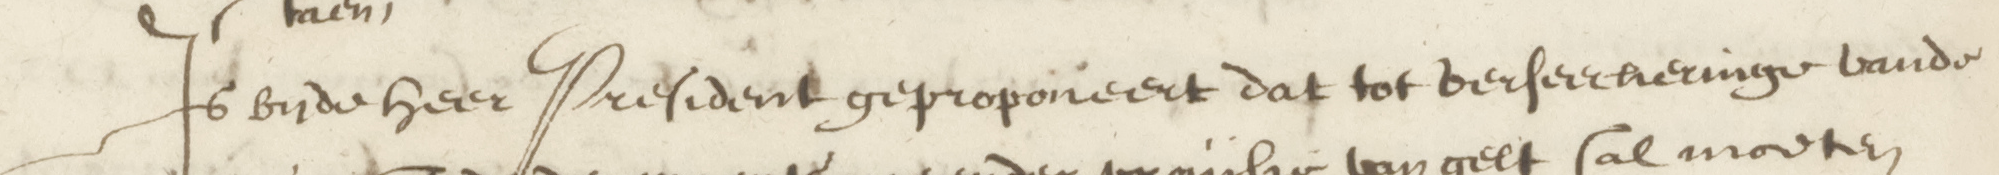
Is byde heer President geproponeert dat tot verseeckeringe vande
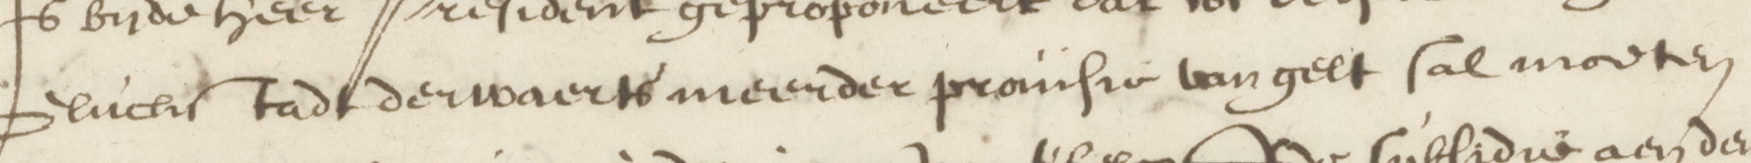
Gluckstadt derwaerts meerder prouisie van gelt sal moeten
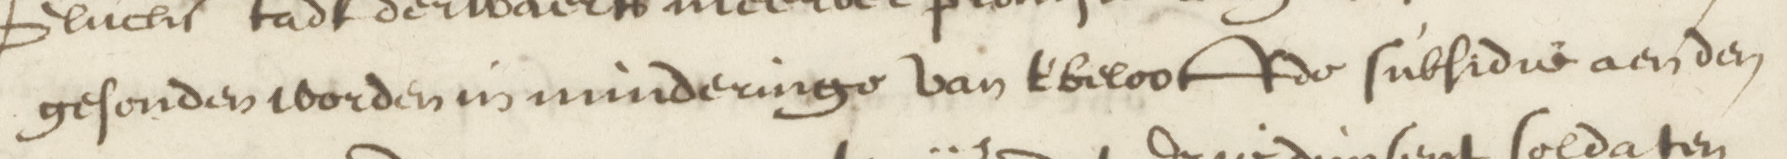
gesonden worden in minderinge van t‛ belooffde subsidie aen den
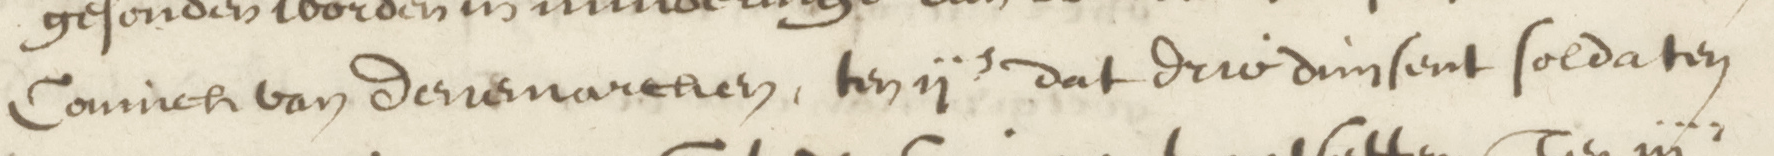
Coninck van Denemarcken, ten ije dat drie duysent soldaten
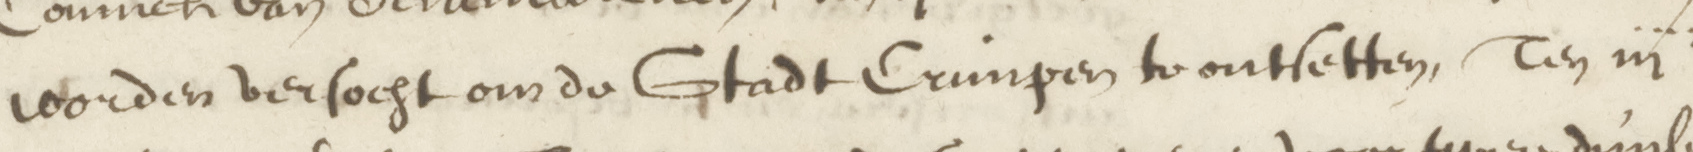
worden versocht om de Stadt Crimpen te ontsetten, Ten iiie
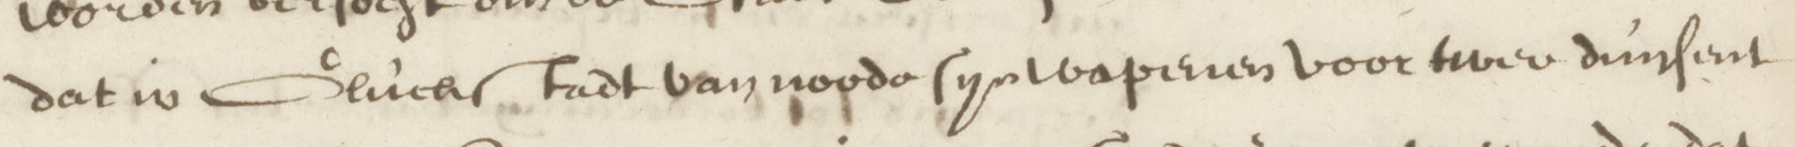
dat in Gluckstadt van noode syn wapenen voor twee duysent
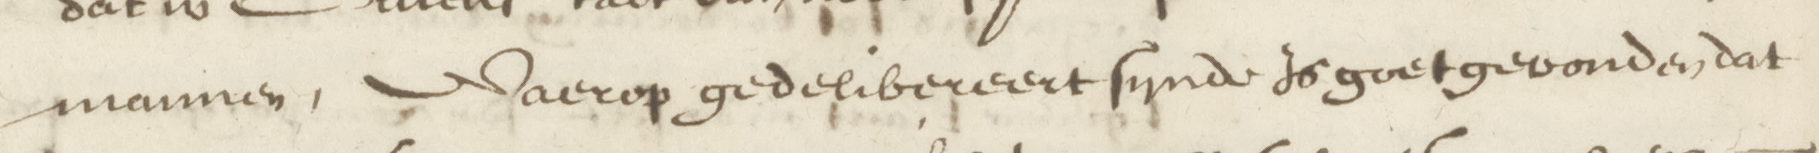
mannen. Waerop gedelibereert synde Is goetgevonden dat
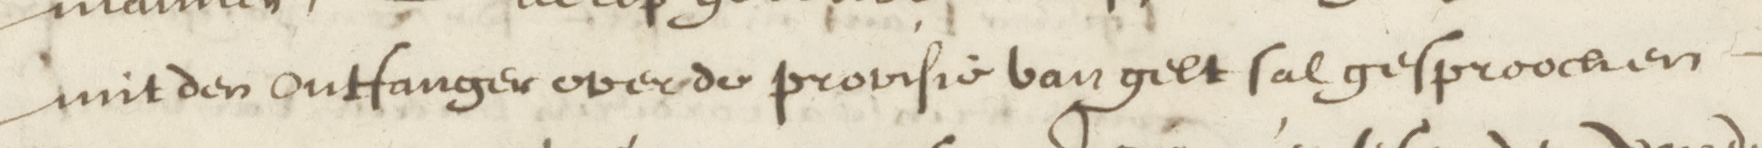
mit den Ontfanger over de provisie van gelt sal gesproocken
